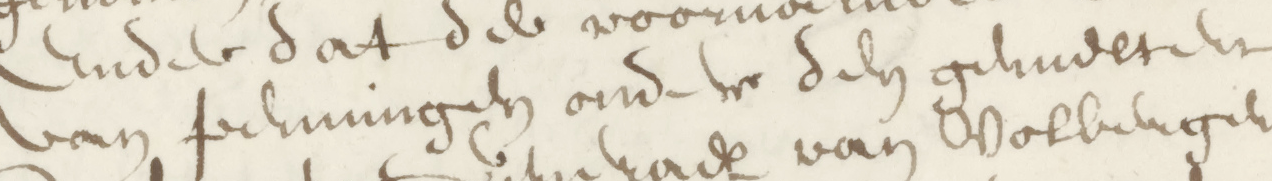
van penningen onder den gemelten
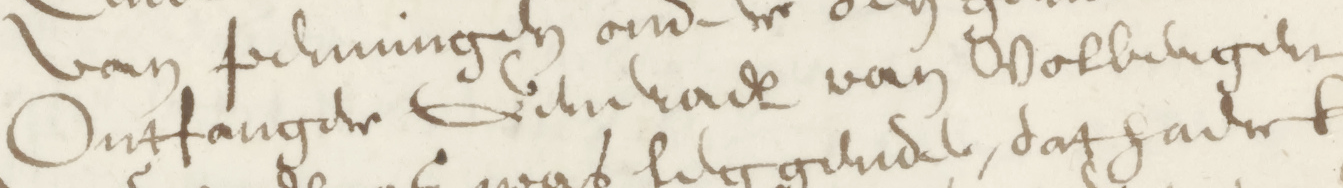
Ontfanger Generael van Volbergen
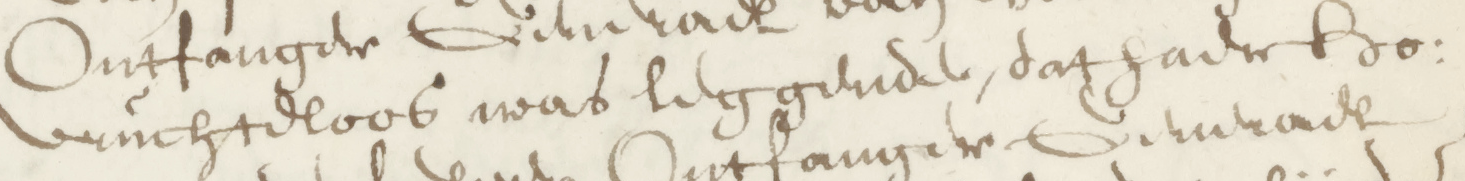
vruchteloos was leggende, dat haer Ho:
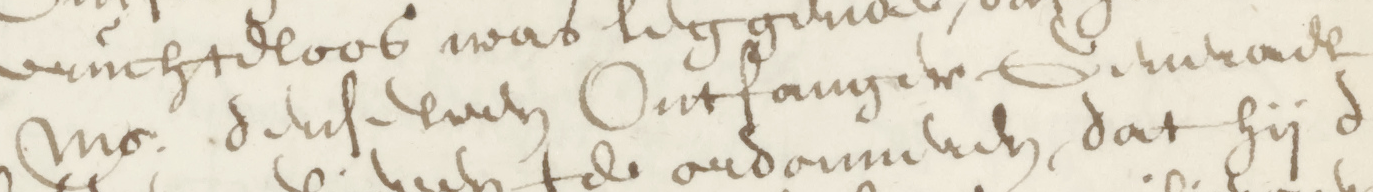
Mo: denselven Ontfanger Generael
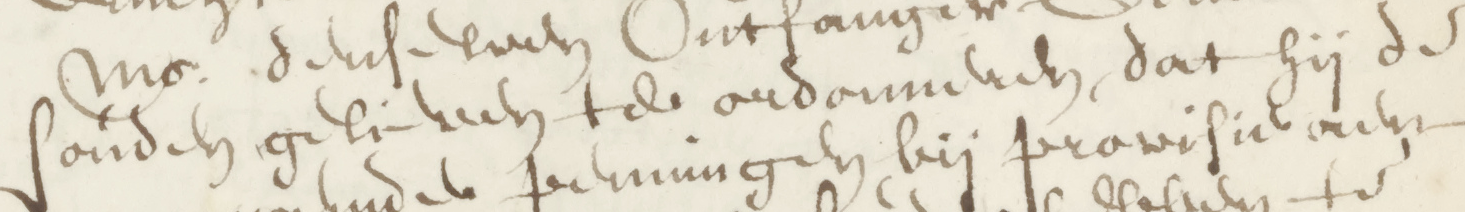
souden gelieven te ordonneren, dat hij de
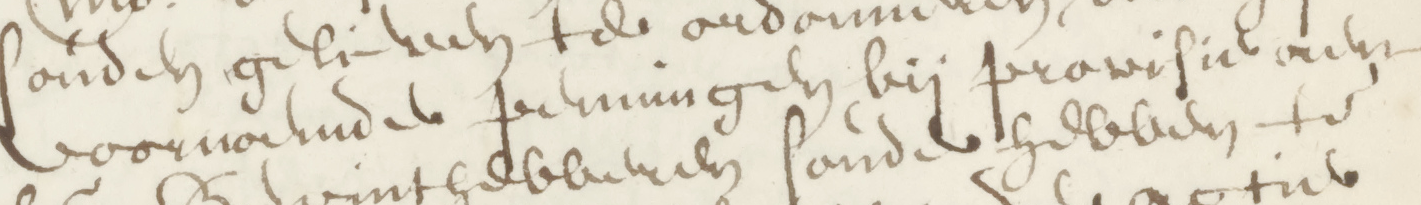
voornoemde penningen bij provisie aen
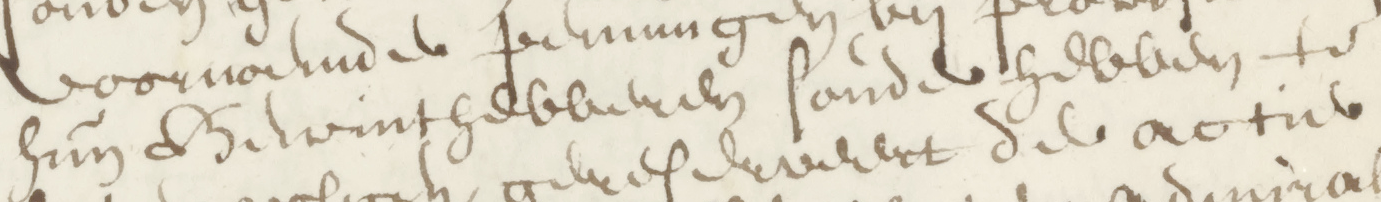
hun Bewinthebberen soude hebben te
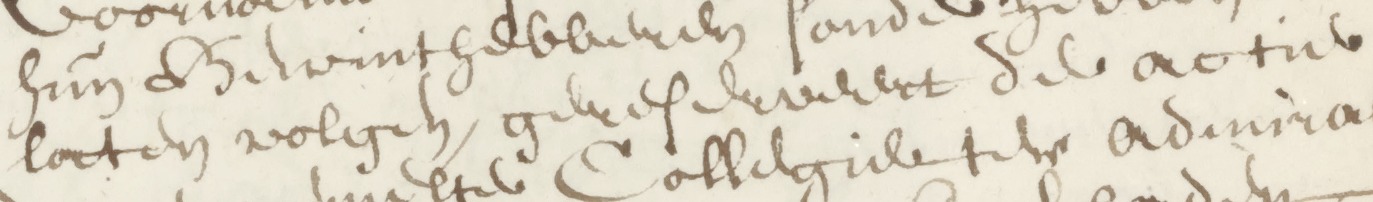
laten volgen, gereserveert de actie
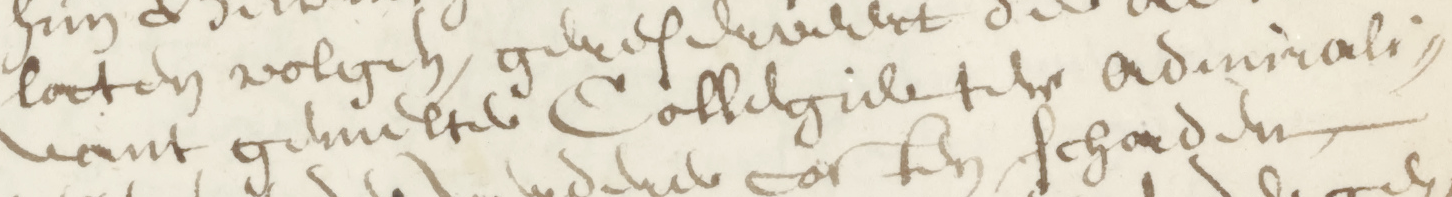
vant gemelte Collegie ter Admirali,,
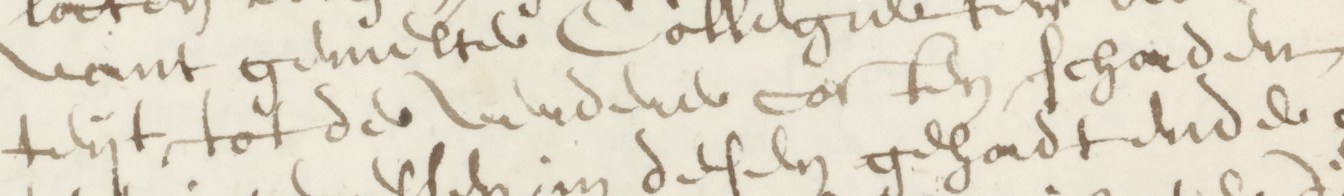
teijt, tot de verdere costen, schaden
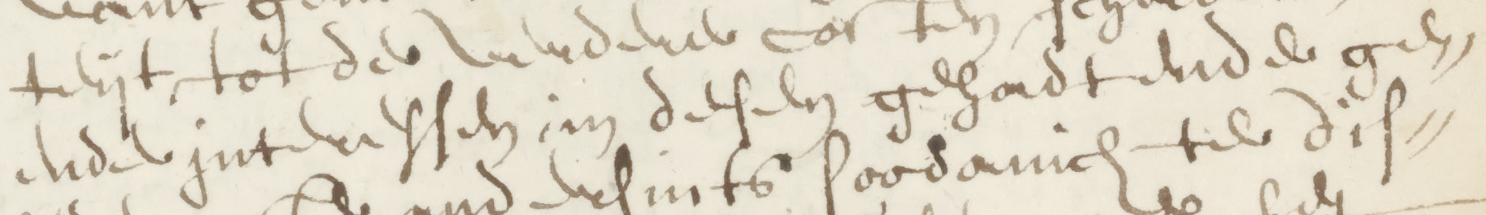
ende interessen, in desen gehadt ende ge,,
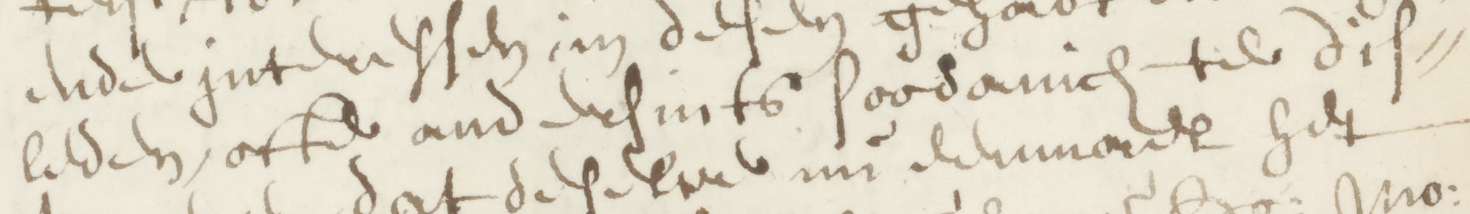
leden, ofte andersints soodanich te dis„
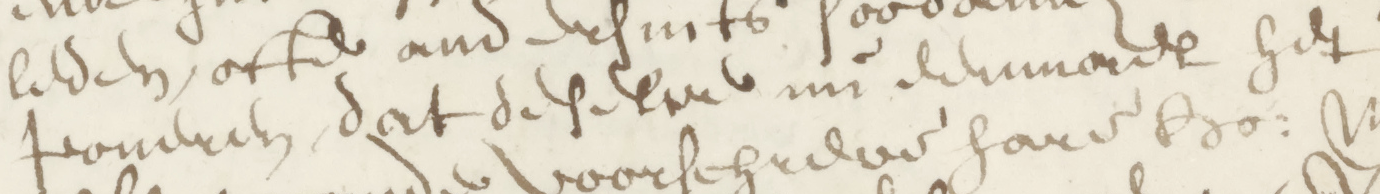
poneren, dat deselve nu eenmael het
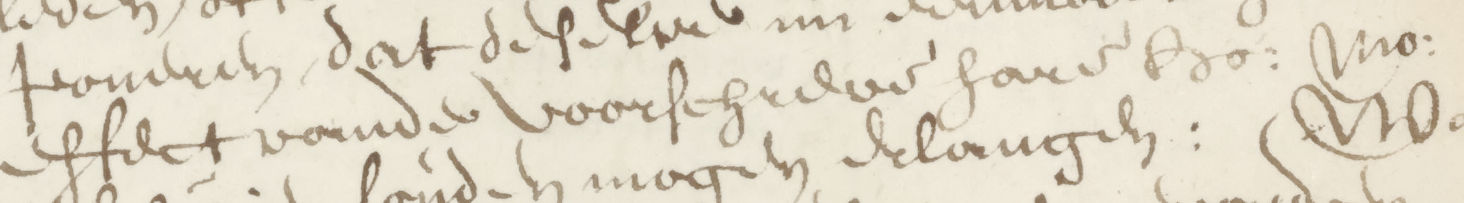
effect vande voorschreve hare Ho:Mo:
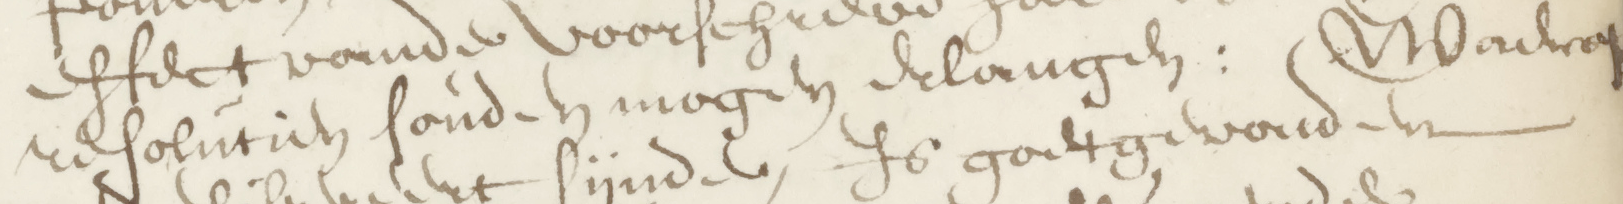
resolutien souden mogen erlangen: Waerop
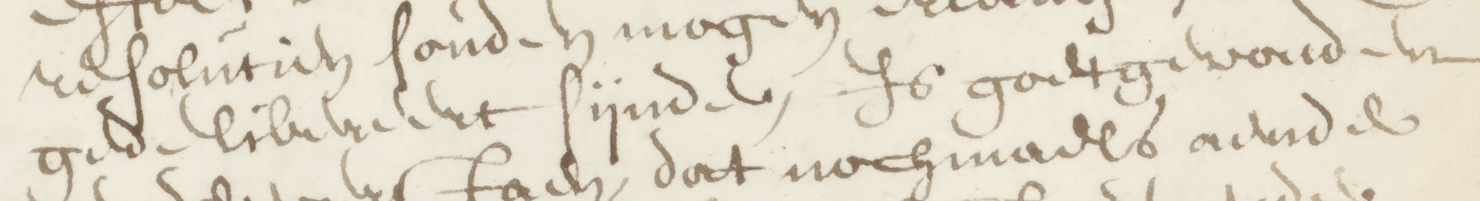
gedelibereert sijnde, Is goetgevonden
